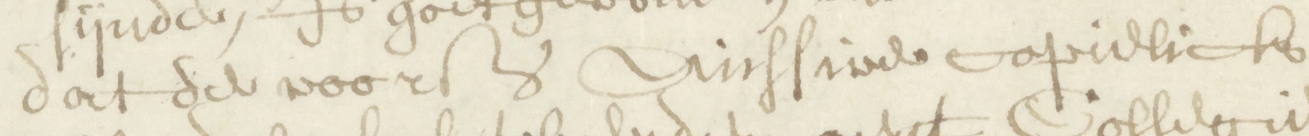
dat de voors missive copielick
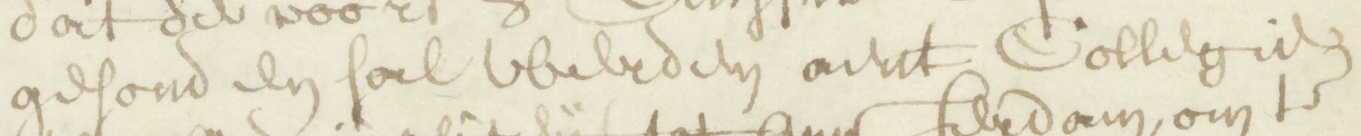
gesonden sal werden aent Collegie
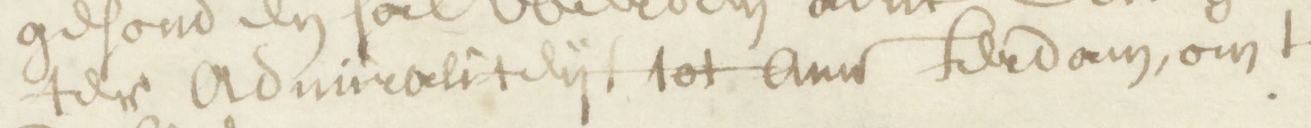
ter Admiraliteijt tot Amsterdam, om te
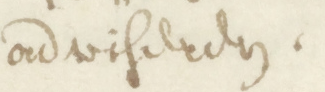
adviseren.
